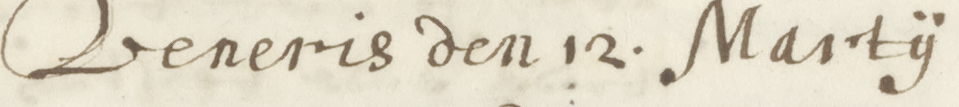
Veneris den 12. Martij
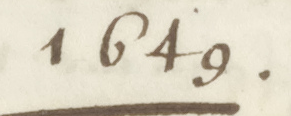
1649.
